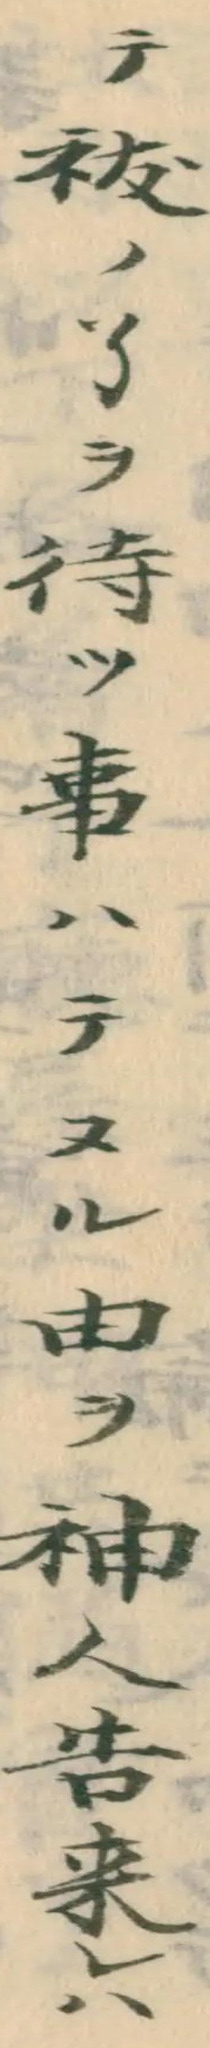テ祓ノ了ヲ待ツ事ハテヌル由ヲ神人告来レハ
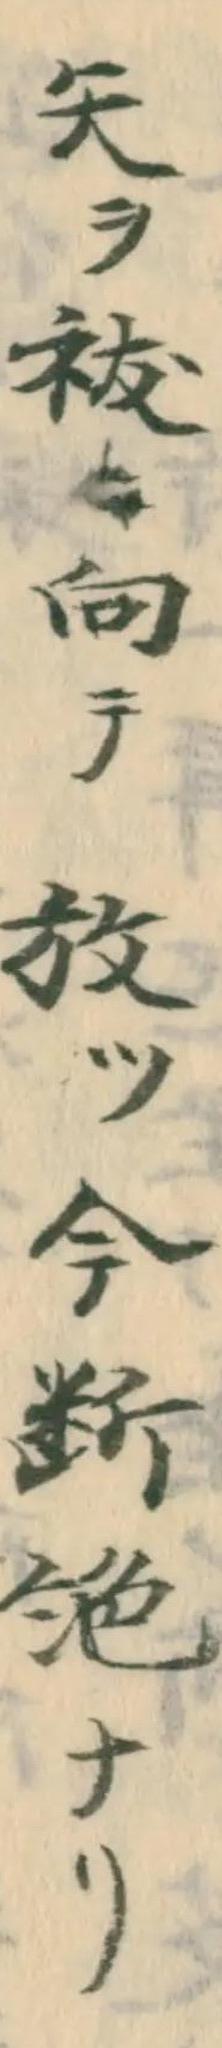矢ヲ祓ニ向テ放ツ今断絶なり
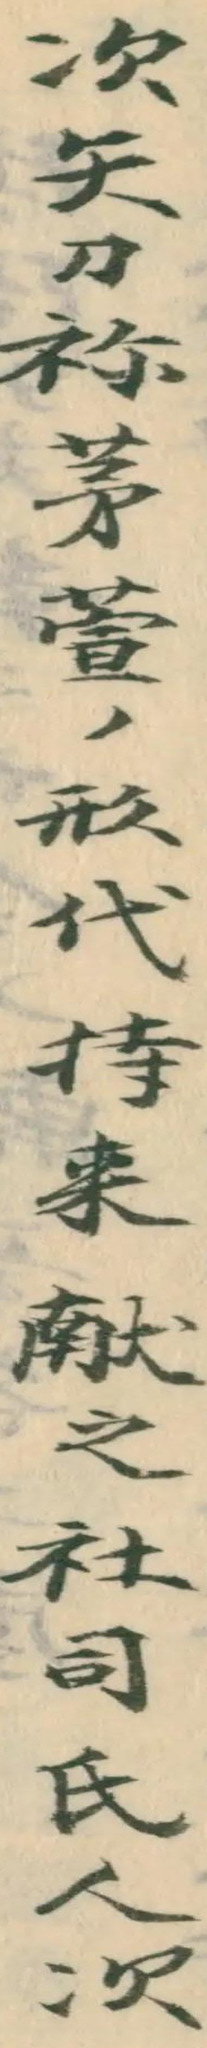次矢刀禰茅萱ノ形代持来献之社司氏人次
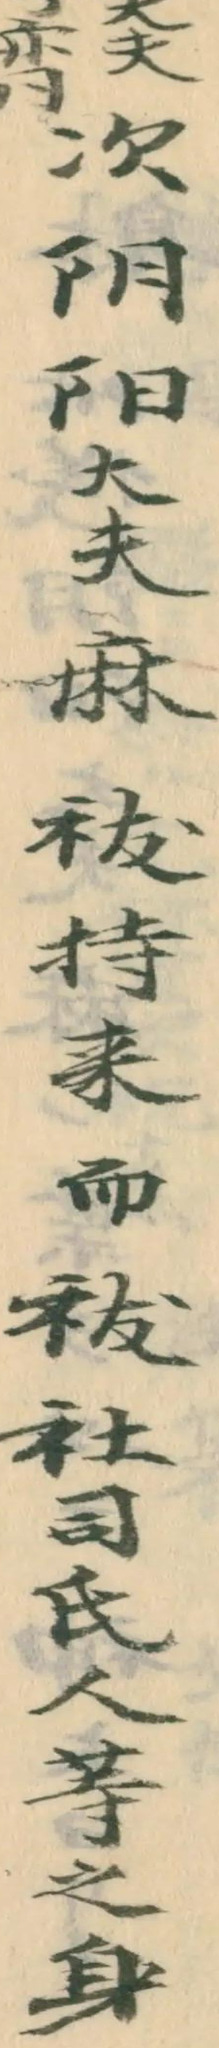次陰陽大夫麻祓持来而祓社司氏人等之身

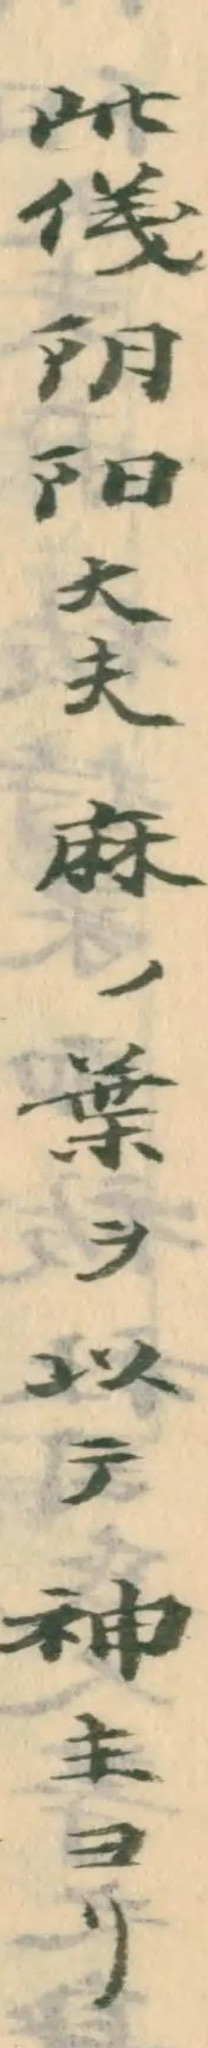体此儀陰陽大夫麻ノ葉ヲ以テ神主ヨリ
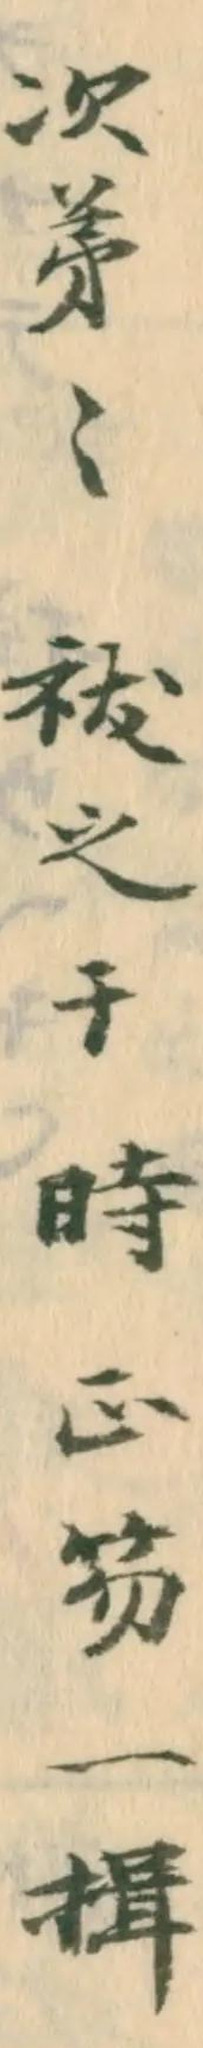次第〳〵祓之于時正笏一揖
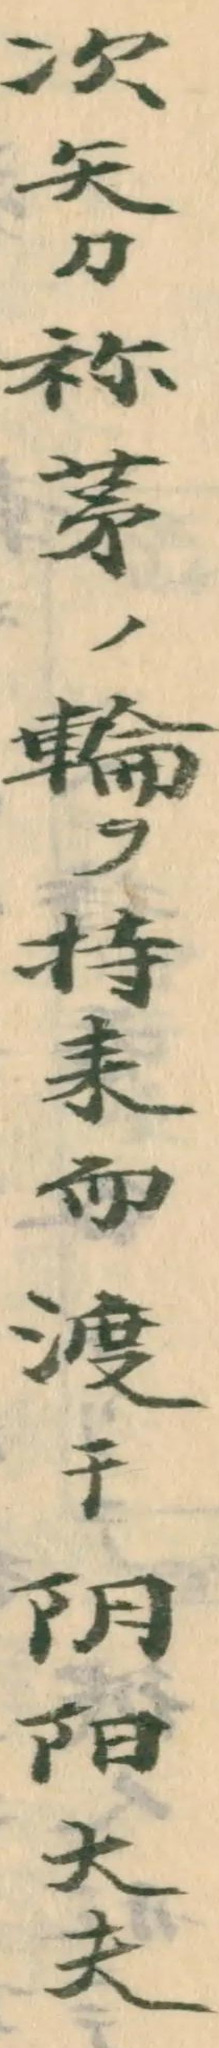次矢刀禰茅ノ輪ヲ持来而渡于陰陽大夫
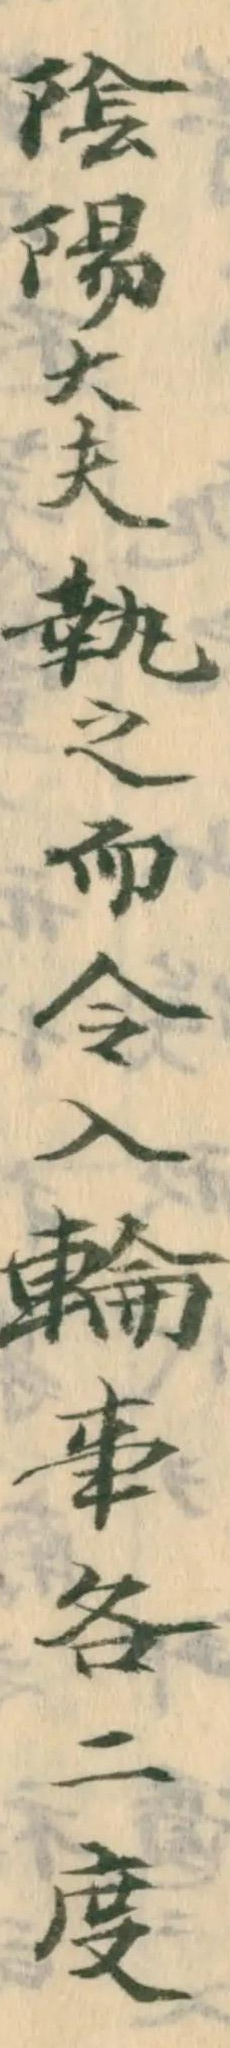陰陽大夫執之而令入輪事各二度
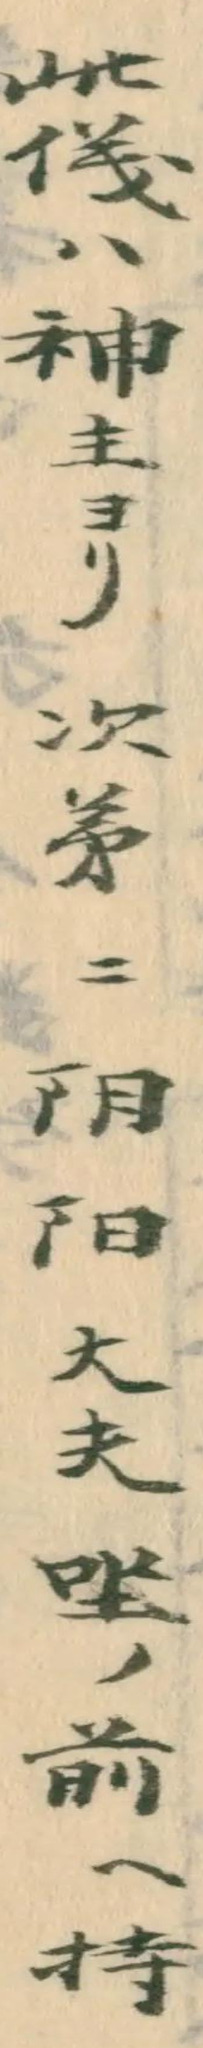此儀ハ神主ヨリ次第ニ陰陽大夫坐ノ前ヘ持
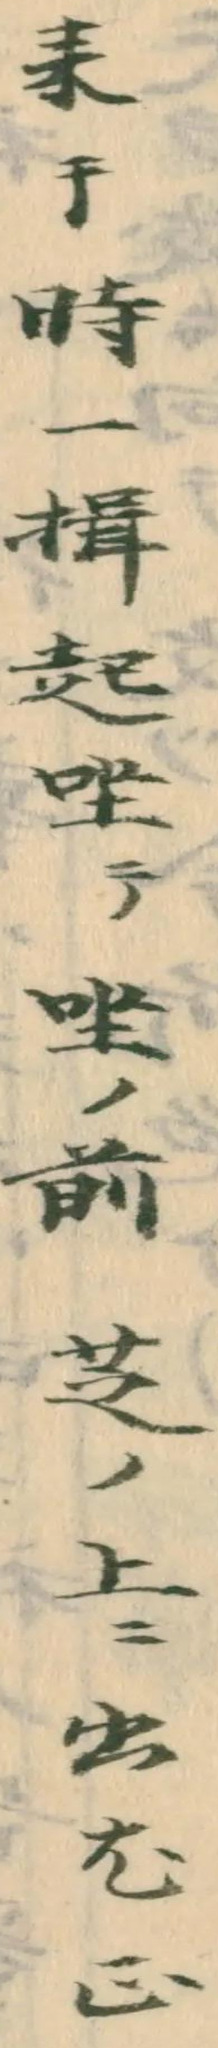来于時一揖起坐テ坐ノ前芝ノ上ニ出尤正
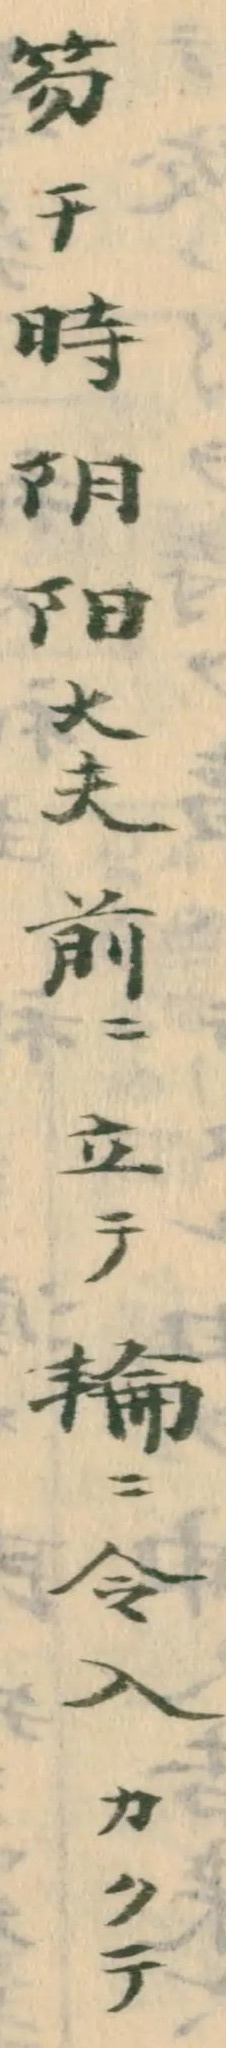笏于時陰陽大夫前ニ立テ輪ニ令入カクテ
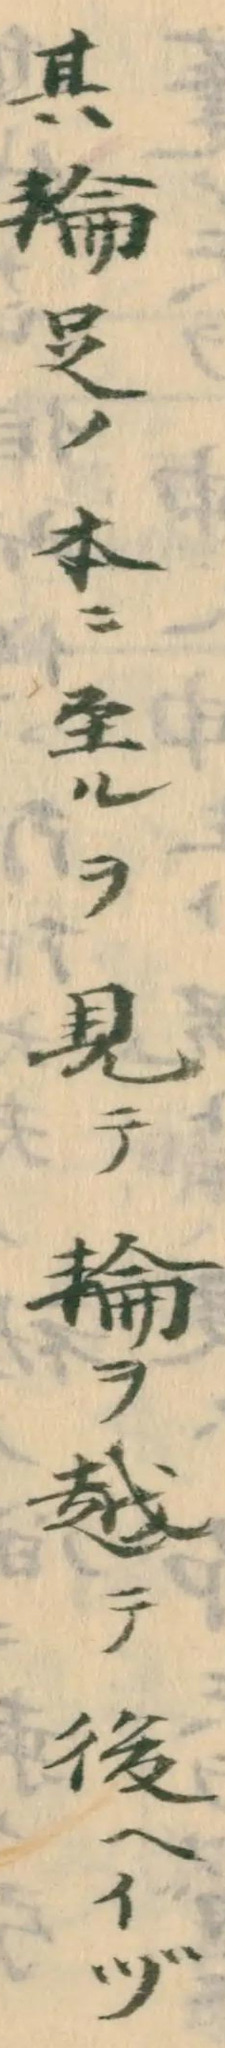其輪足ノ本ニ至ルヲ見テ輪ヲ越テ後ヘイヅ
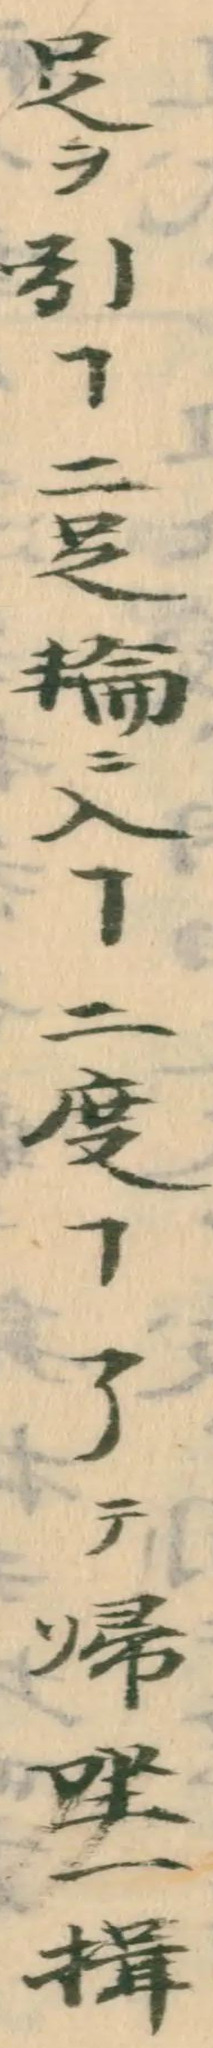足ヲ引コト二足輪ニ入コト二度コト了テ帰坐一揖
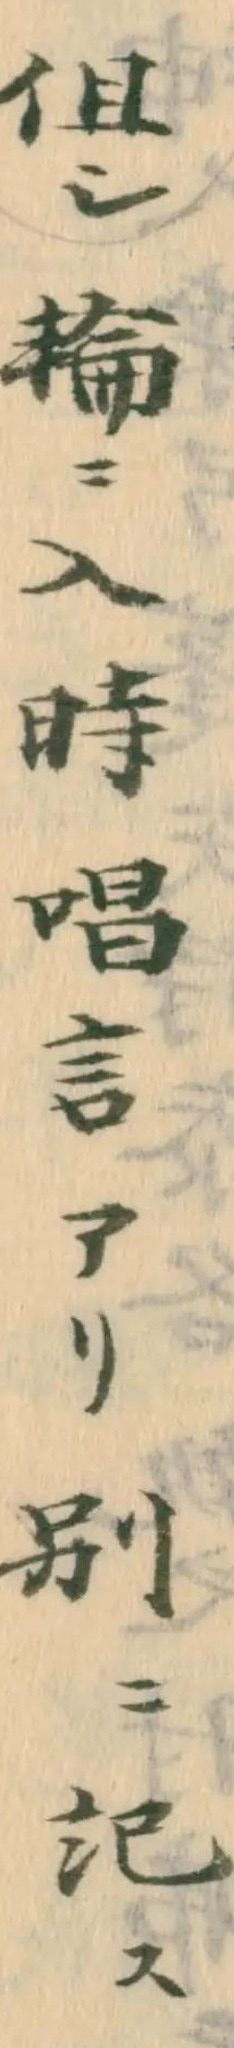但シ輪ニ入時唱言アリ別ニ記ス
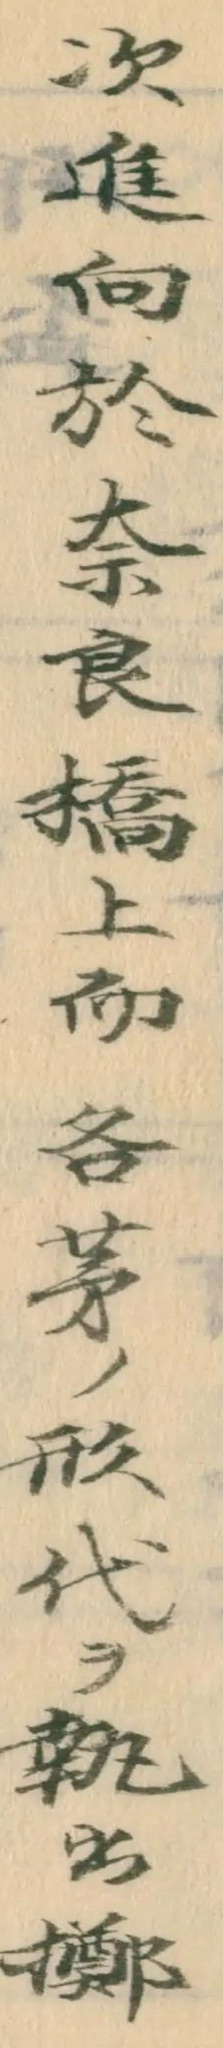次進向於奈良橋上而各茅ノ形代ヲ執出擲
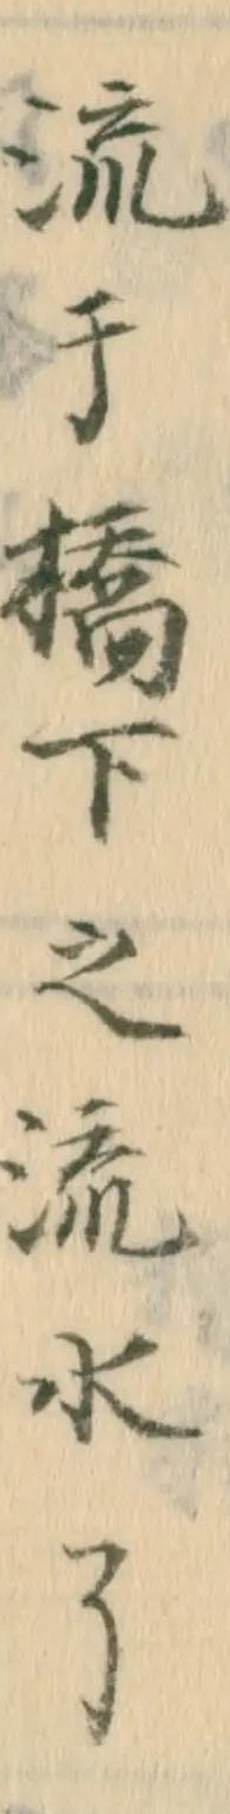流于橋下之流水了
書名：賀茂社記録. 第5冊
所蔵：国立国会図書館 National Diet Library, JAPAN
